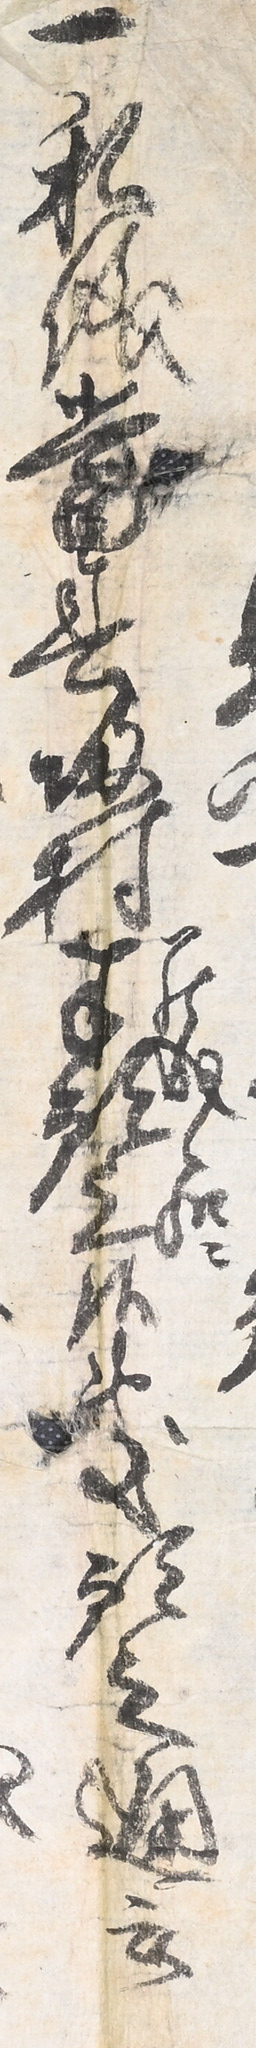一私儀当春長坂村奉願上候処願之通被
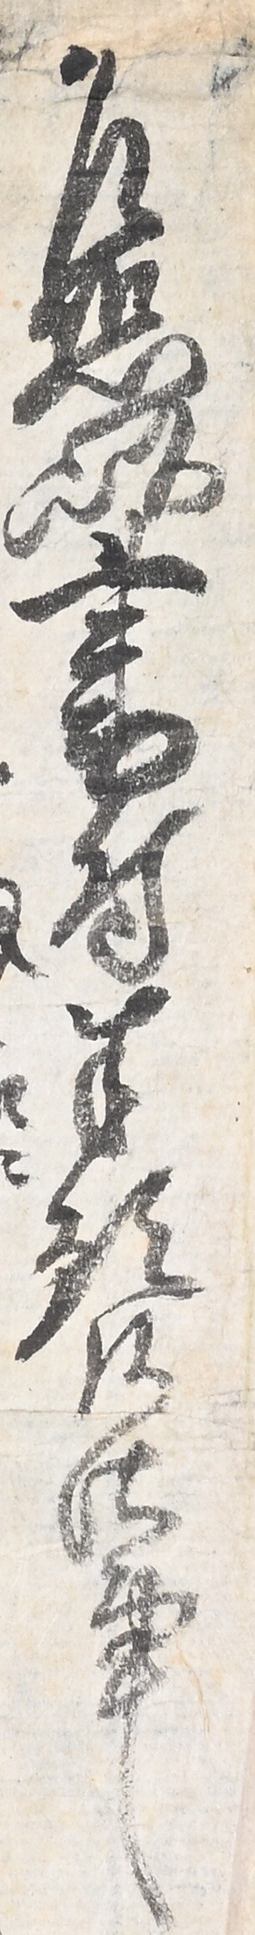乍恐以書付奉願候御事
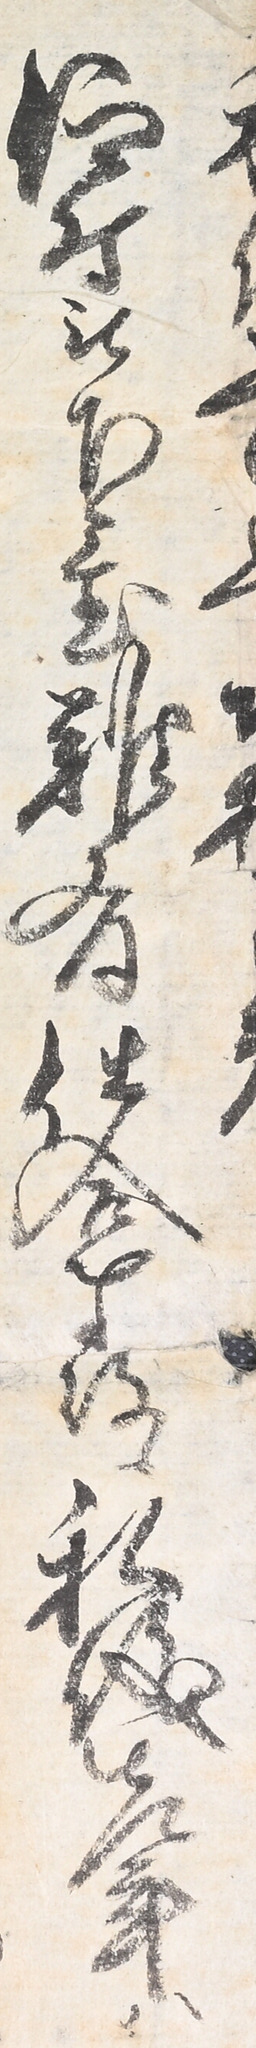仰付被下置難有仕合奉存候私儀先年ハ
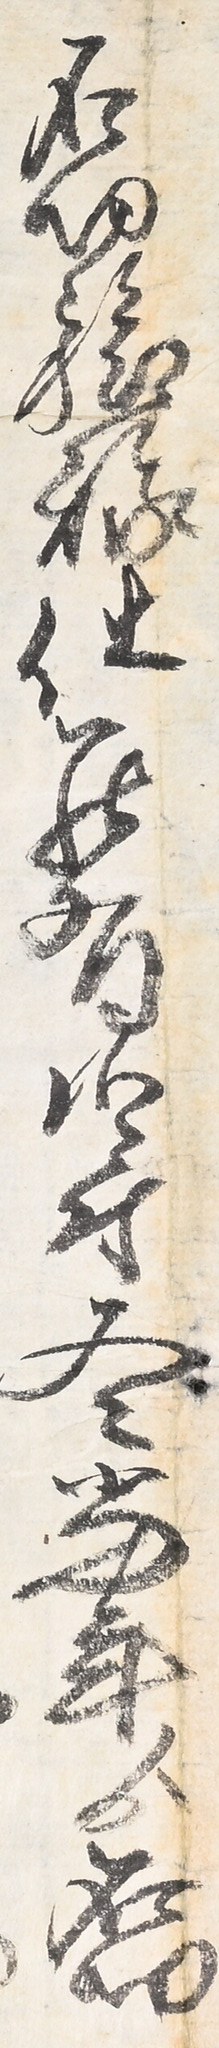石切旅稼仕罷有候ニ付又々当年ゟ石切
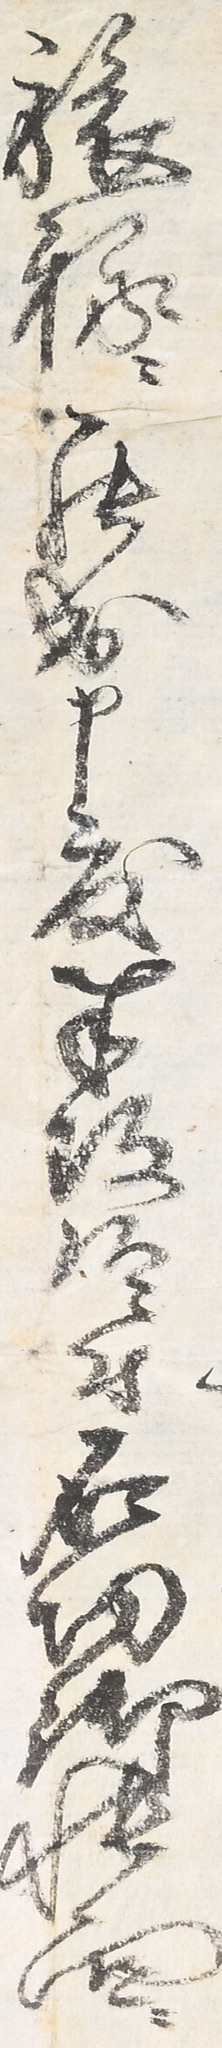旅稼ニ罷出申度奉存候ニ付石切御帳面
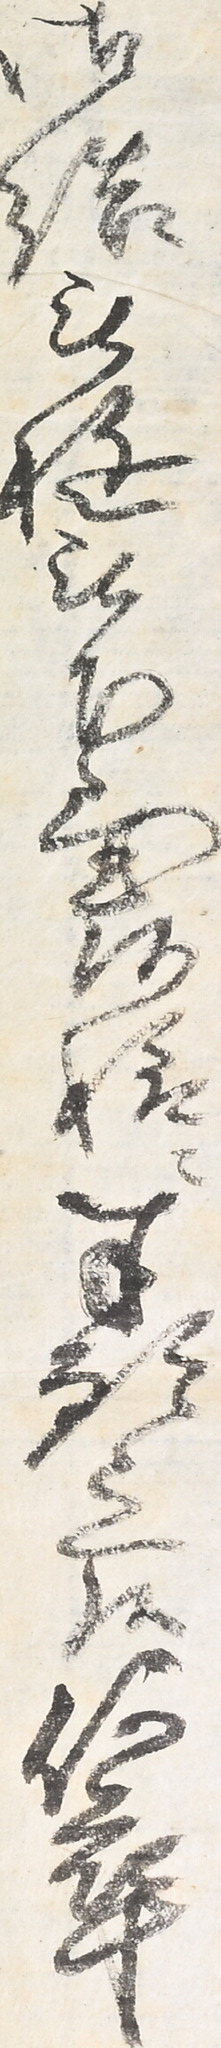御詰被遊被下置候様ニ奉願上候何卒
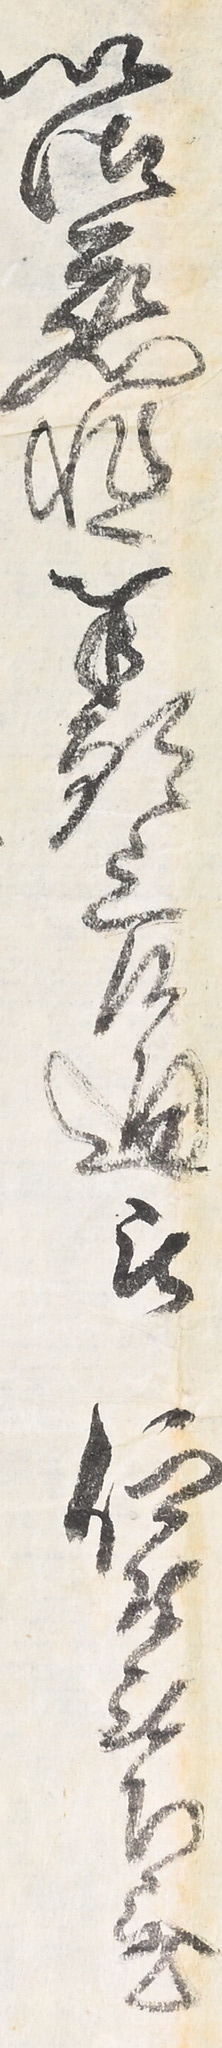以御慈悲奉願上候通被仰付被下置
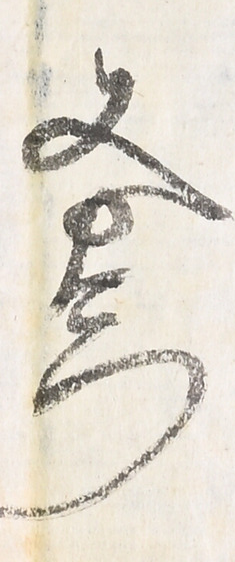又右衛門
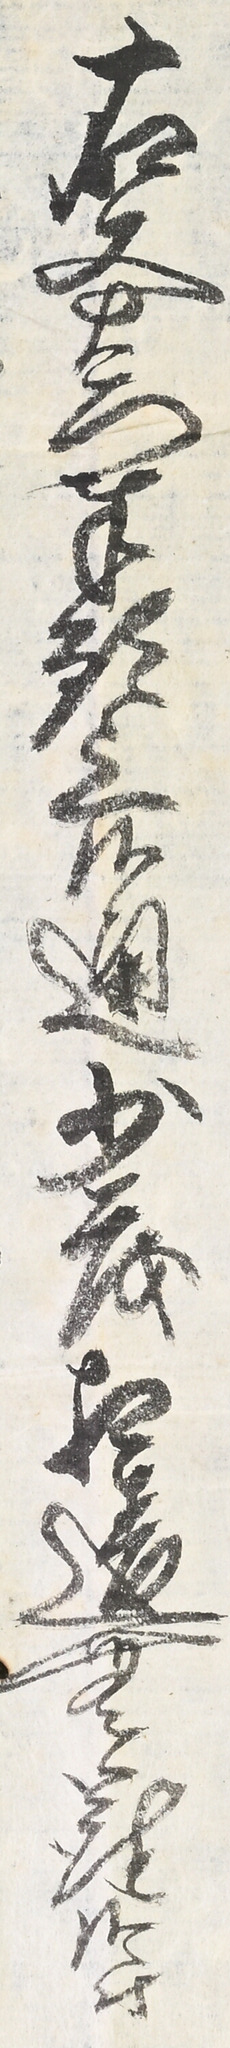右又右衛門奉願上候通少茂相違無御座候ニ付
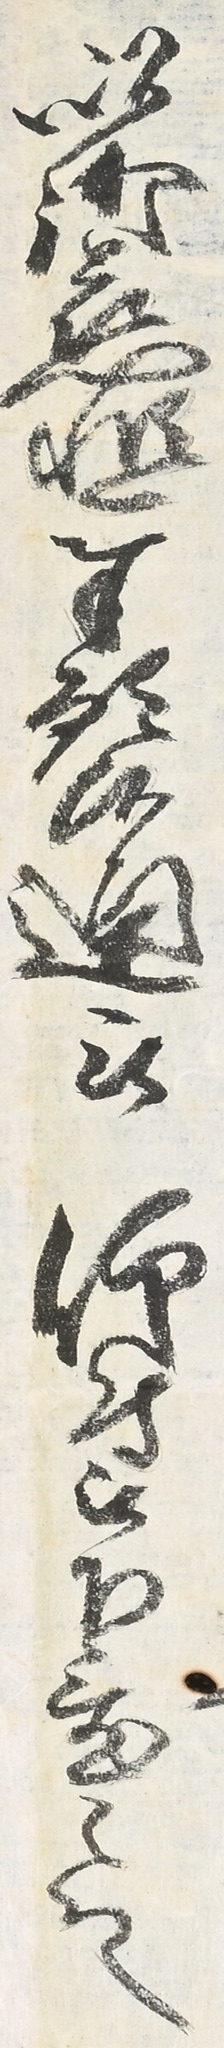以御慈悲奉願候通被仰付被下置候ハヽ
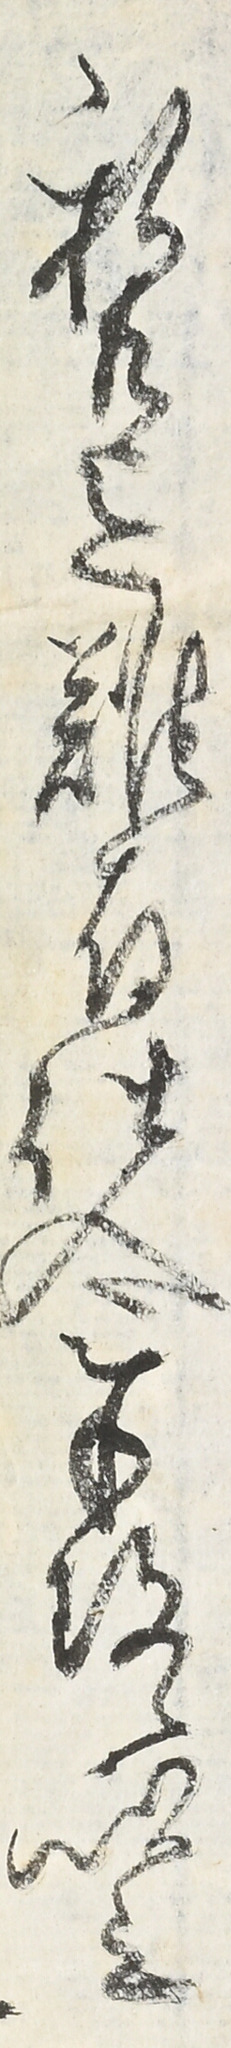私共迄難有仕合奉存候以上
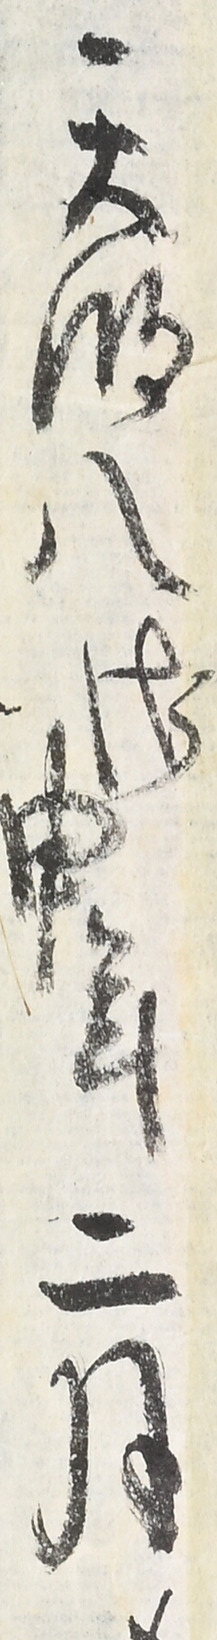天明八戊申年二月
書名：乍恐以書付奉願候御事
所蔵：伊那市立高遠町図書館・合同会社AMANE
